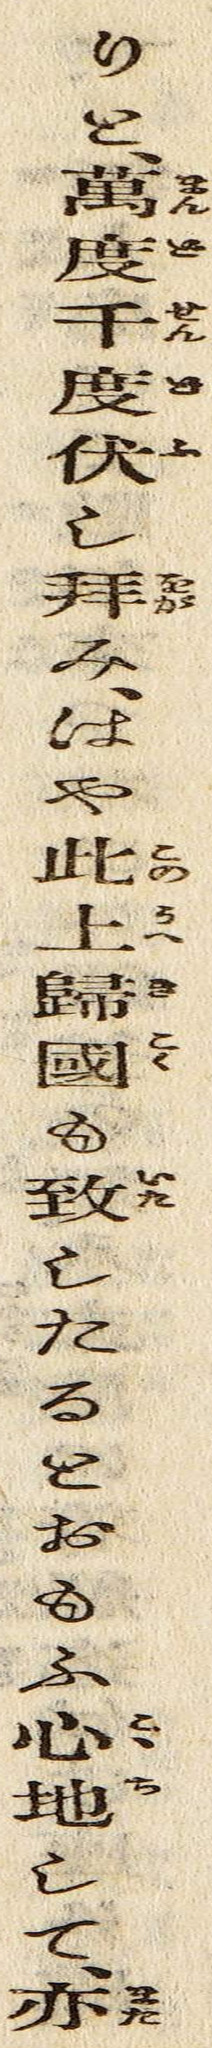りと、万度千度伏し拝み、はや此上帰国も致したるとおもふ心地して、亦
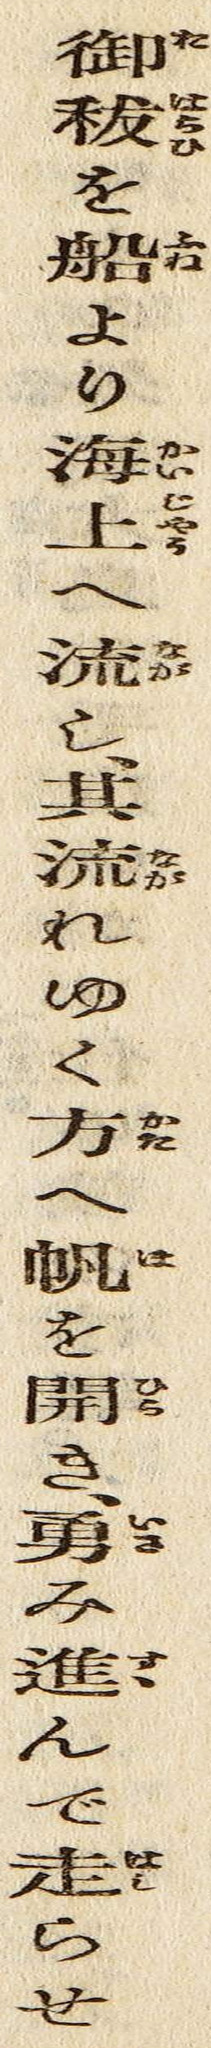御祓を船より海上へ流し、其流れゆく方へ帆を開き、勇み進んで走らせ
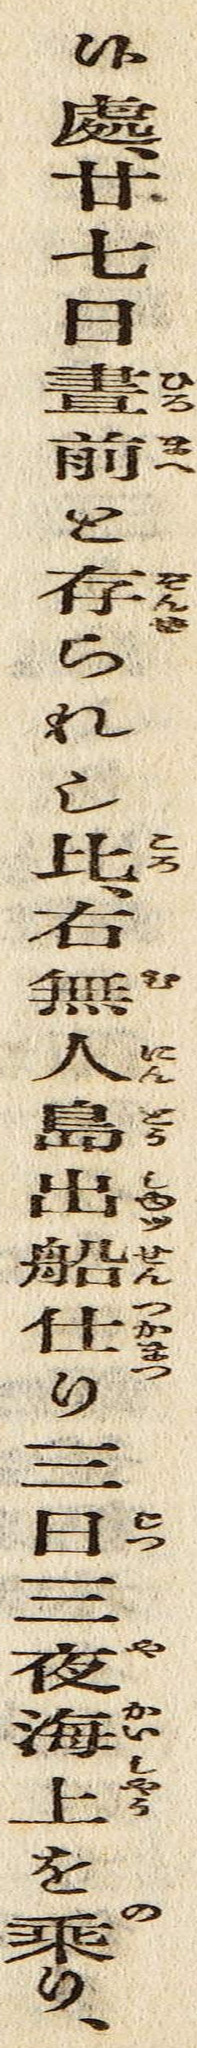候処、廿七日昼前と存られし比、右無人島出船仕り三日三夜海上を乗り、
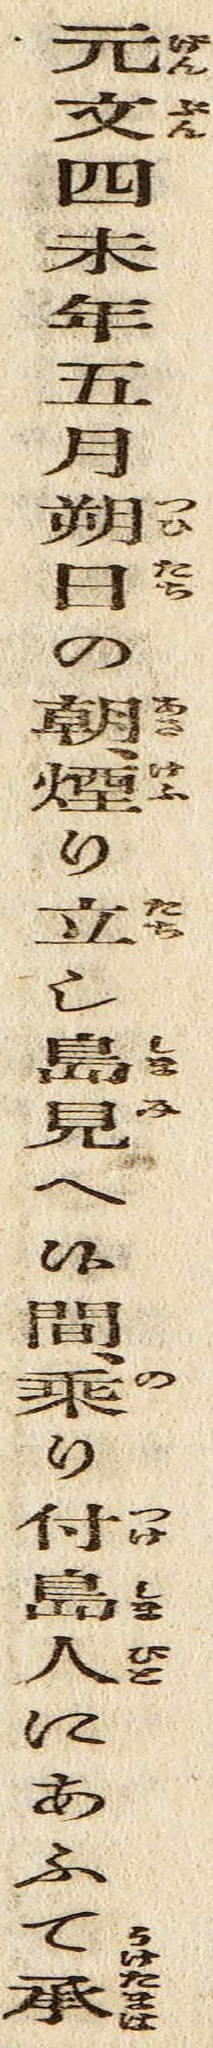元文四未年五月朔日の朝、煙り立し島見へ候間、乗り付島人にあふて承
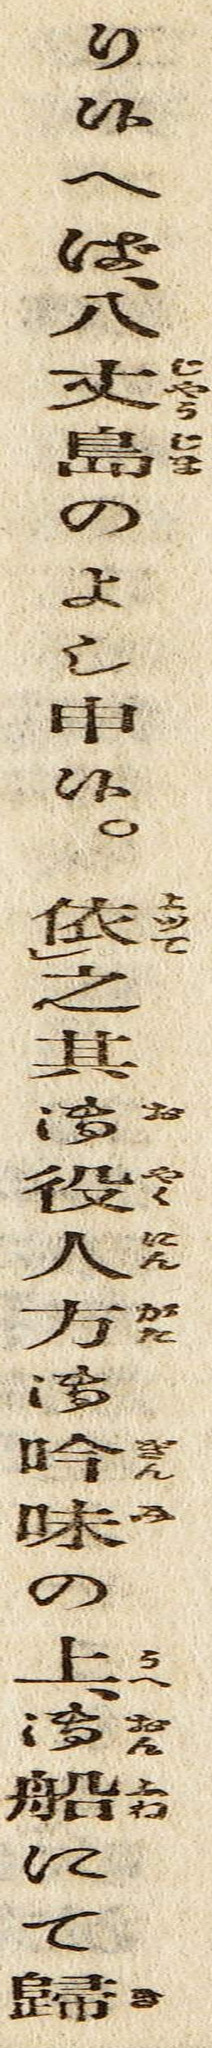り候へば、八丈島のよし申候。依之其御役人方御吟味の上、御船にて帰
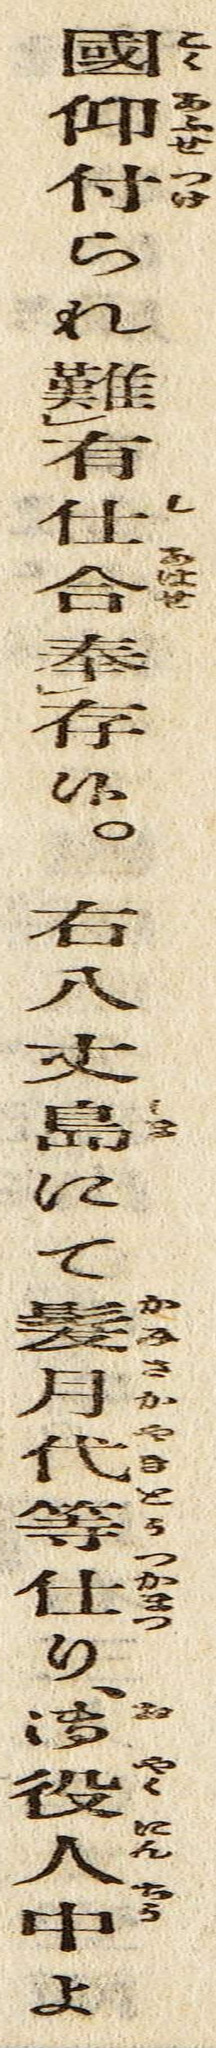国仰付られ難有仕合奉存候。右八丈島にて髪月代等仕り、御役人中よ
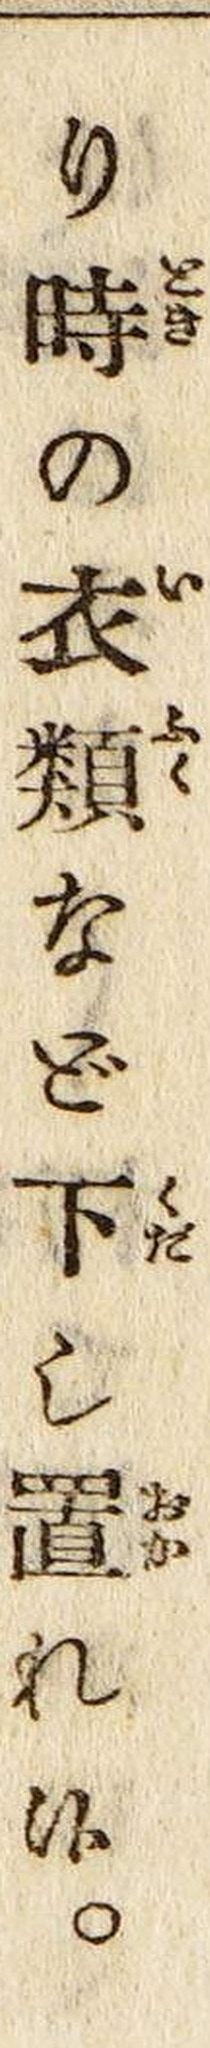り時の衣類など下し置れ候。
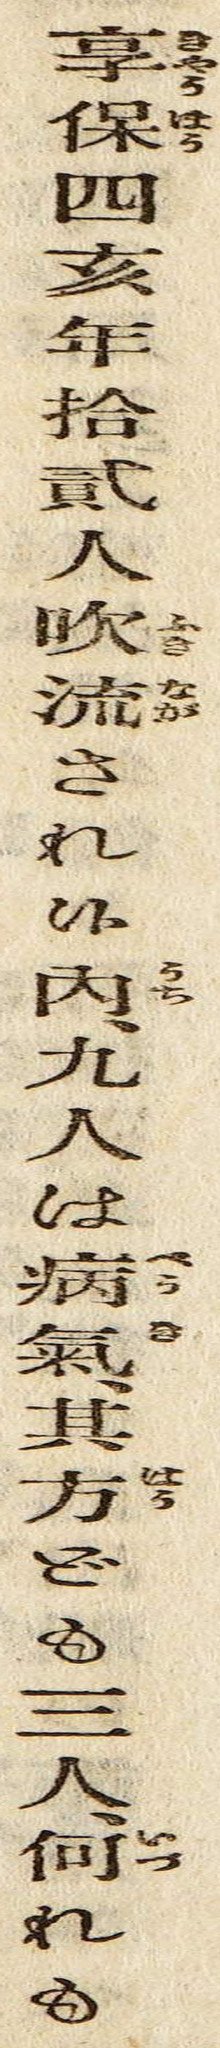享保四亥年拾弐人吹流され候内、九人は病気、其方ども三人、何れも
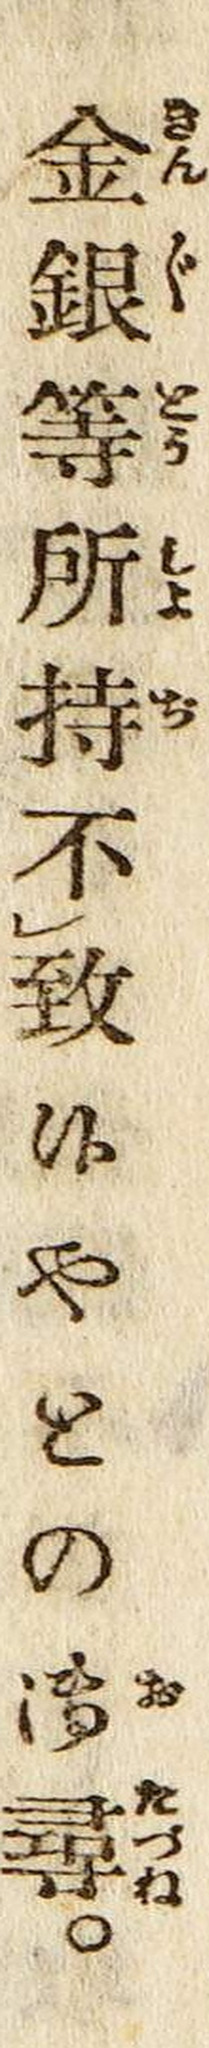金銀等所持不致候やとの御尋。
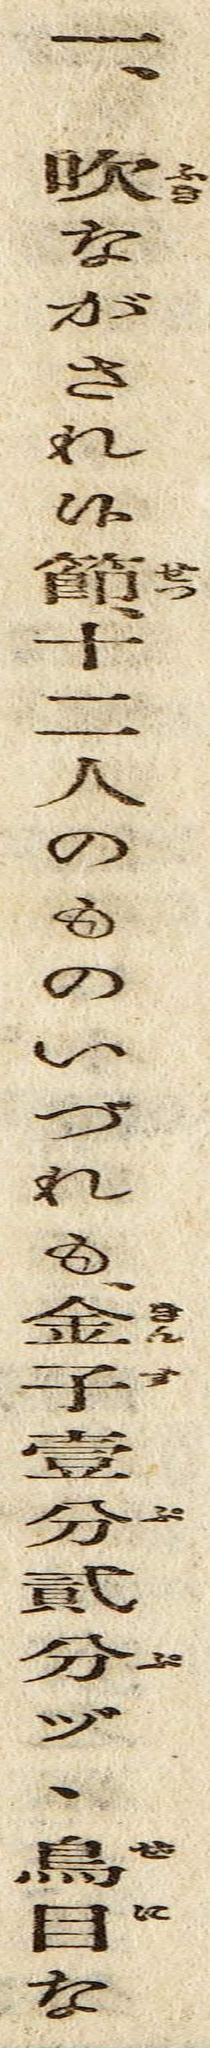一、吹ながされ候節、十二人のものいづれも、金子壱分弐分ヅヽ鳥目な
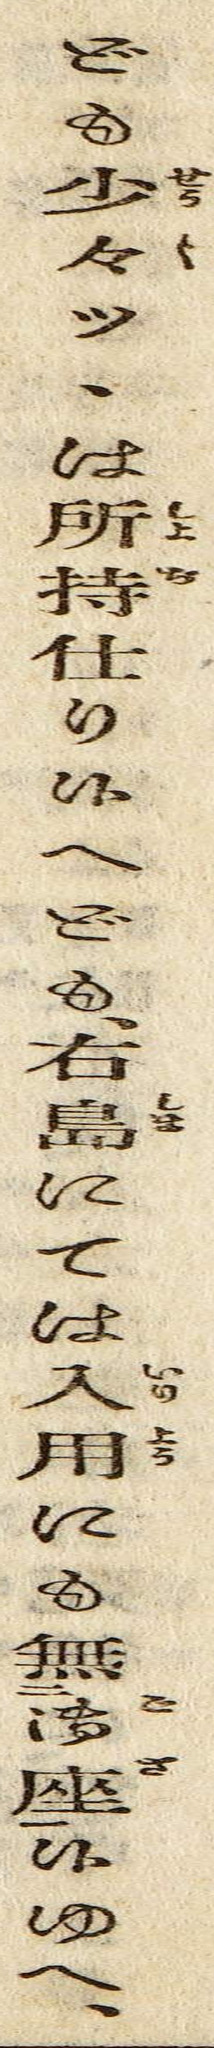ども少々ツヽは所持仕り候へども、右島にては入用にも無御座候ゆへ、

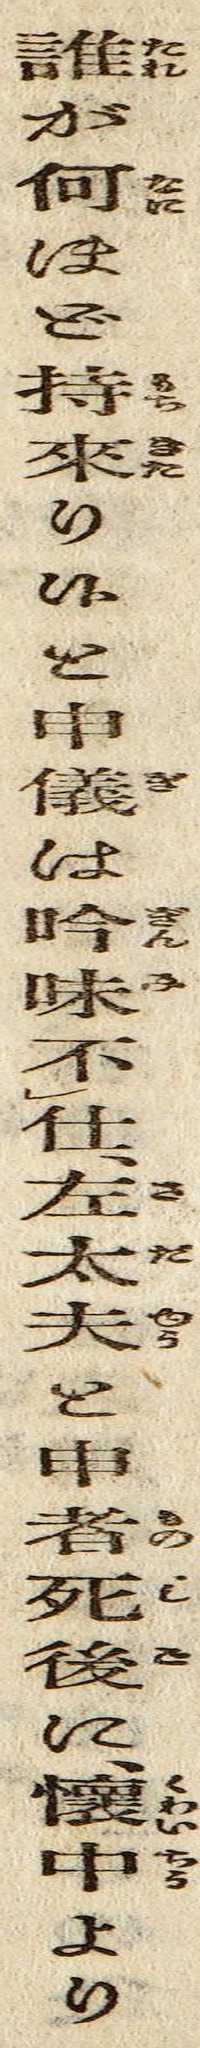誰が何ほど持来り候と申儀は吟味不仕、左太夫と申者死後に、懐中より
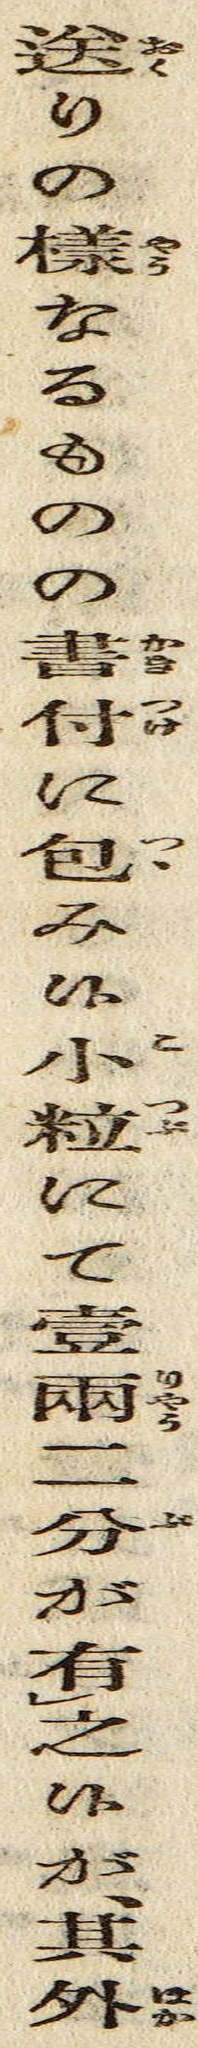送りの様なるものの書付に包み候小粒にて壱両二分が有之候が、其外
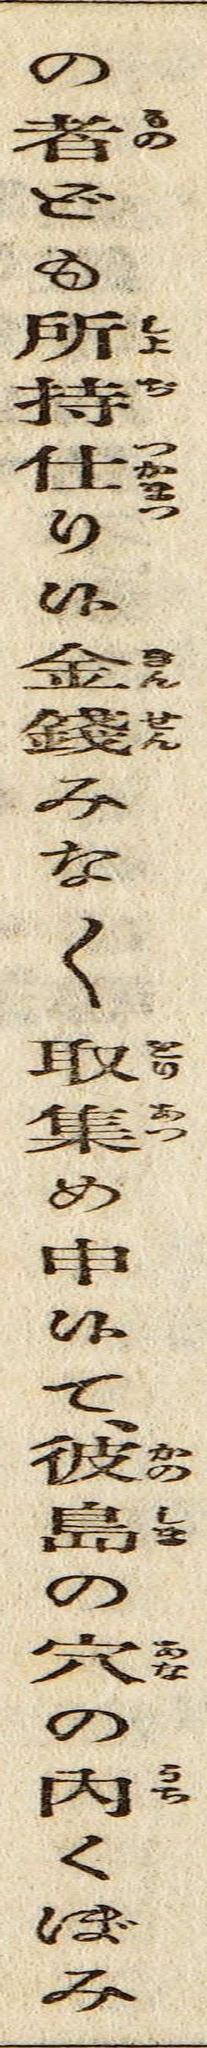の者ども所持仕り候金銭みな〳〵取集め申候て、彼島の穴の内くぼみ
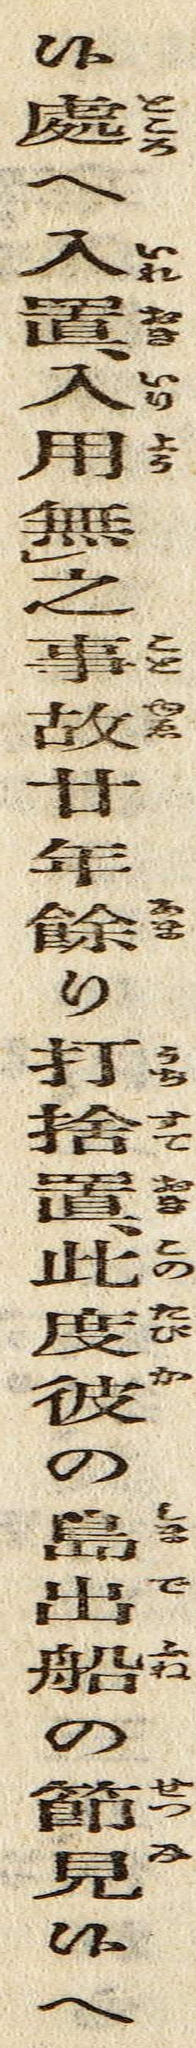候処へ入置、入用無之事故廿年余り打捨置、此度彼の島出船の節見候へ
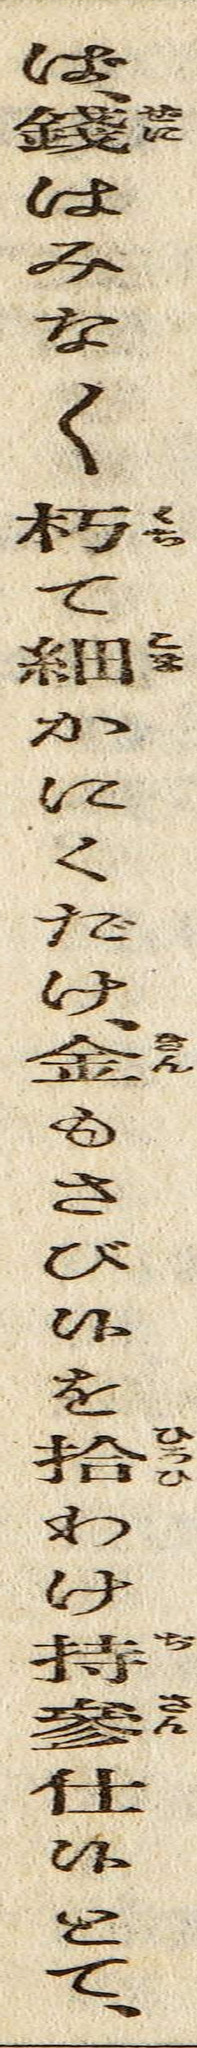ば、銭はみな〳〵朽て細かにくだけ、金もさび候を拾わけ持参仕候とて、
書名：日本漂流譚
